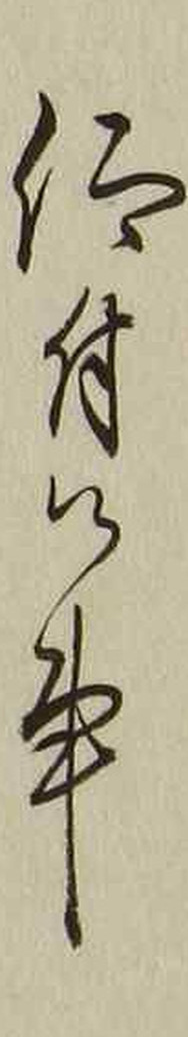仰付候事
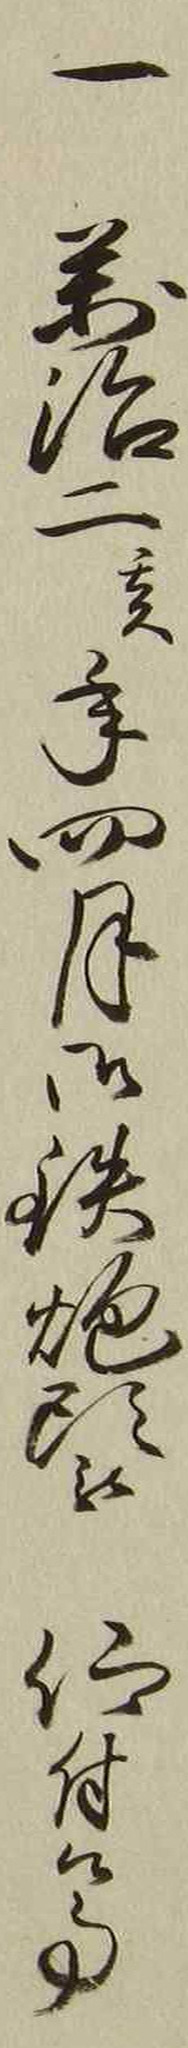一万治二亥年四月御鉄炮頭被仰付候事
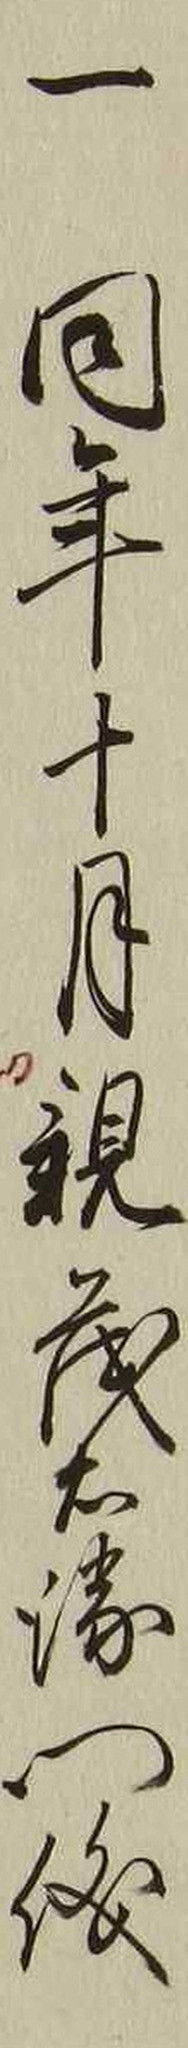一同年十月親茂右衛門儀
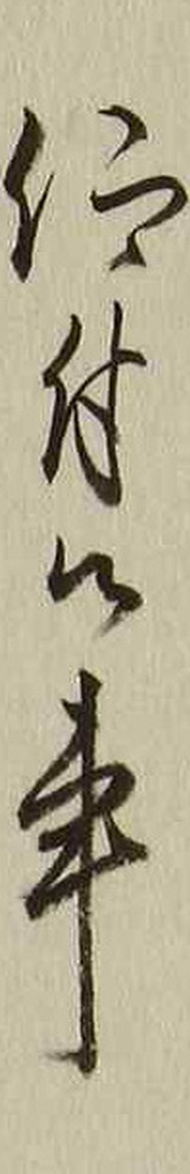仰付候事
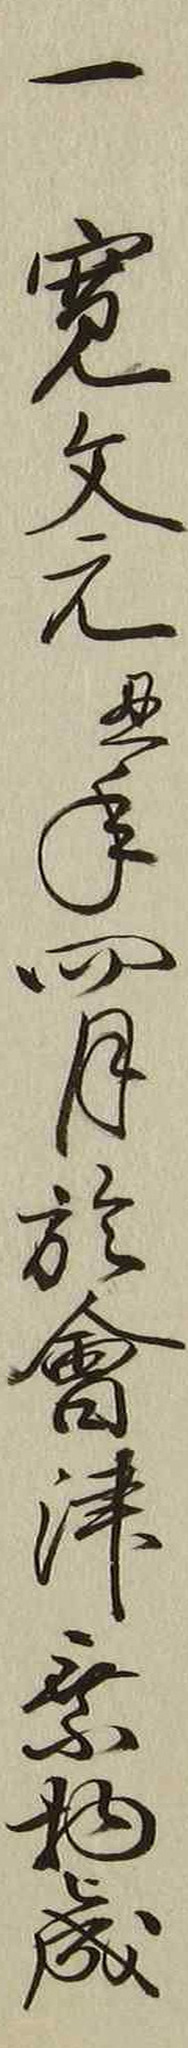一寛文元丑年四月於会津乗物被成
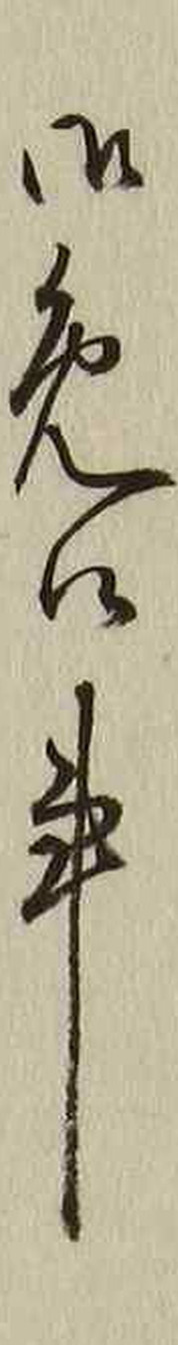御免候事
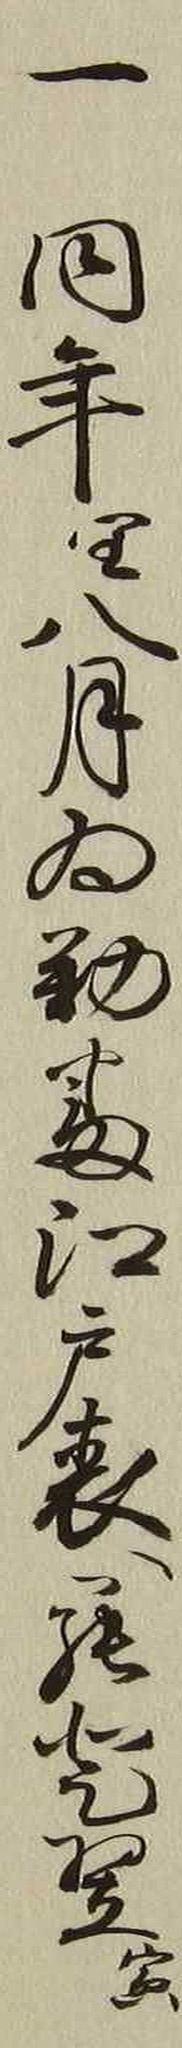一同年閏八月勤番江戸表へ罷登翌寅
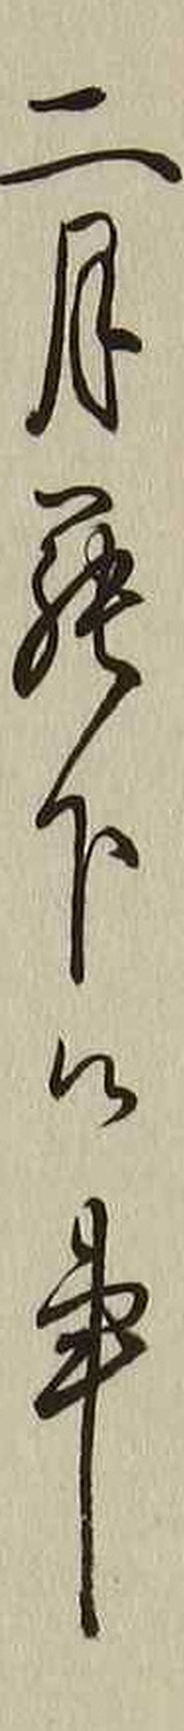二月罷下候事
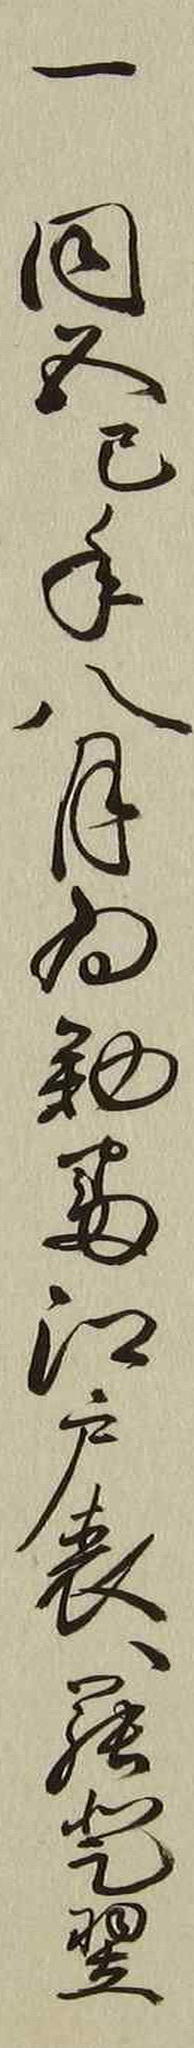一同五巳年八月為勤番江戸表へ罷登翌
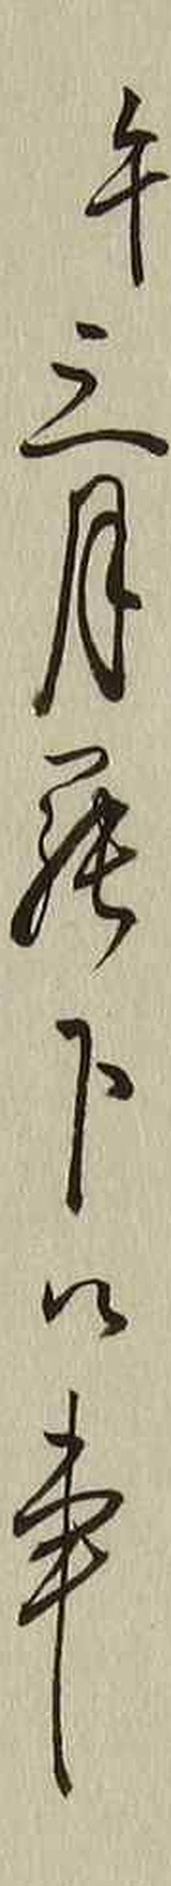午三月罷下候事
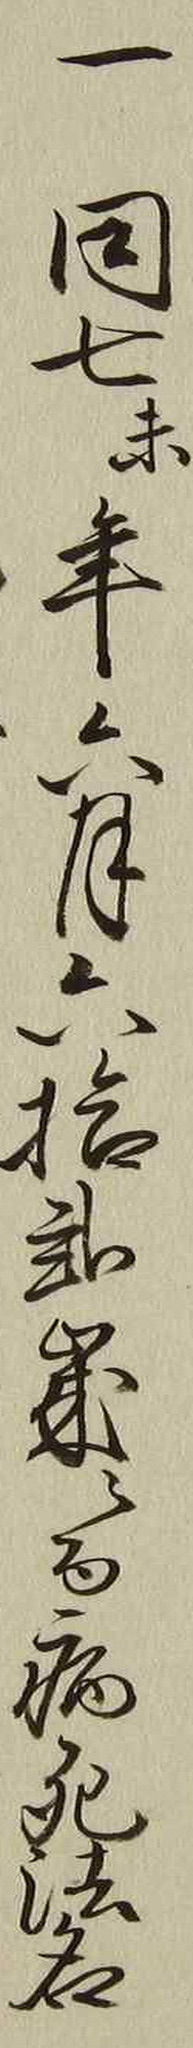一同七未年六月六拾弐歳ニ而病死法名
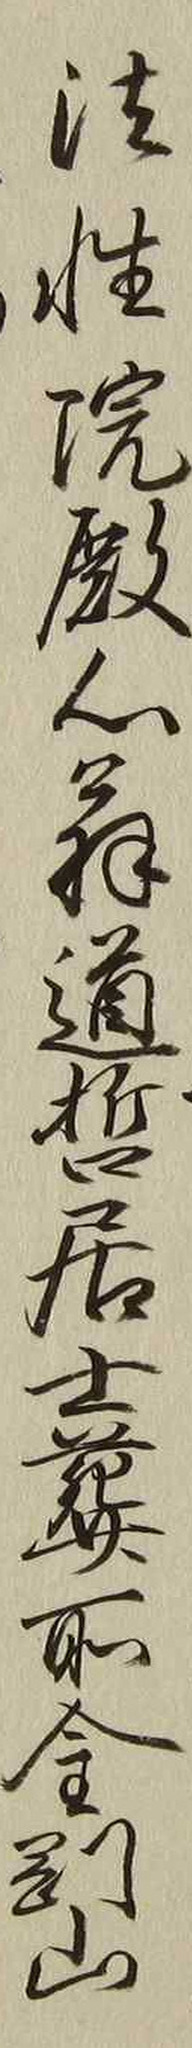法性院殿心翁道哲居士葬所金剛山
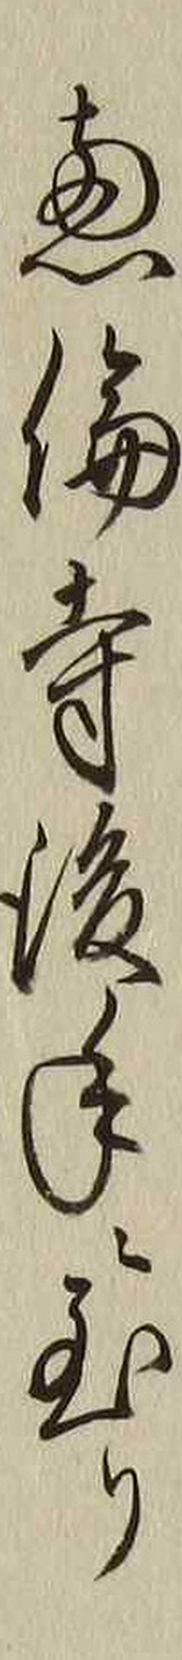恵倫寺後年ニ至り
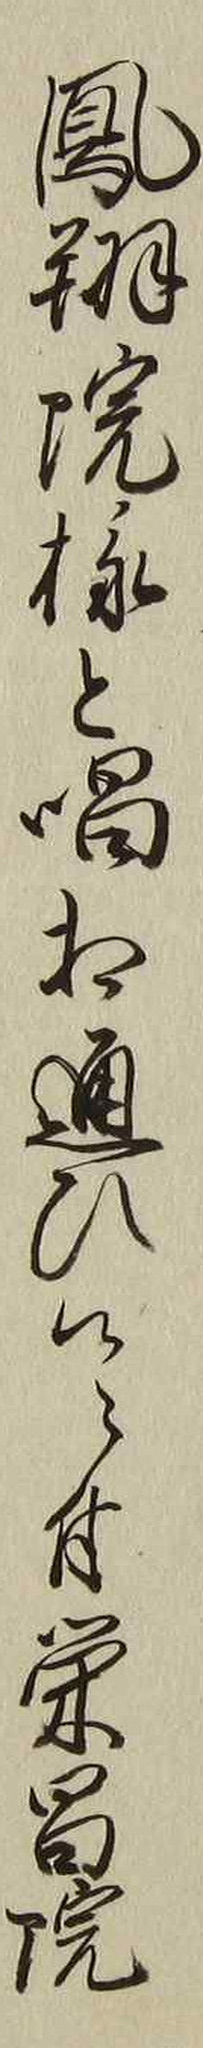鳳翔院様と唱相通ひ候ニ付栄昌院
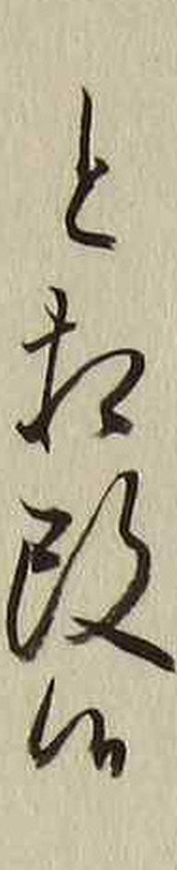と相改候
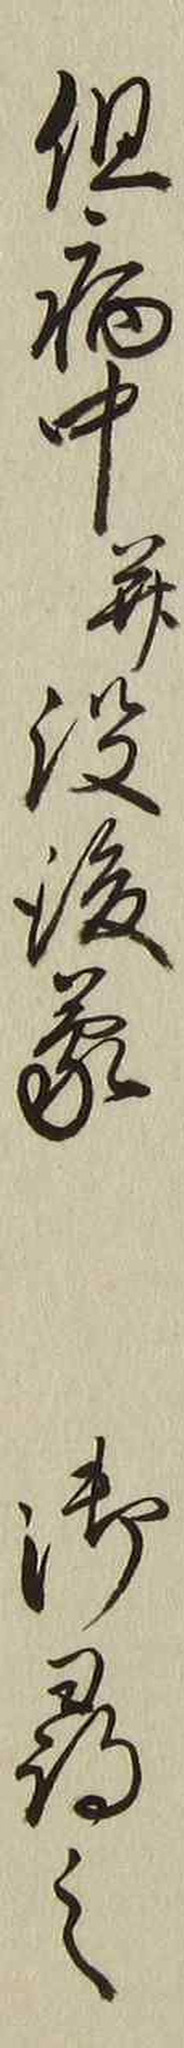但病中并没後蒙御尋之
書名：諸士系譜　巻之21　い之部21
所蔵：会津若松市立会津図書館
